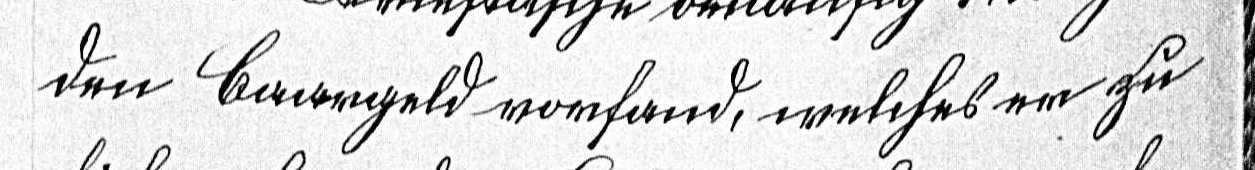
den Caergeld vorfand, welches er zu
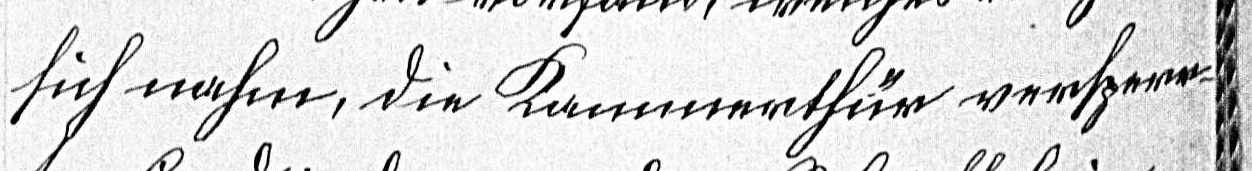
sich nahm, die Kammerthür versperr¬
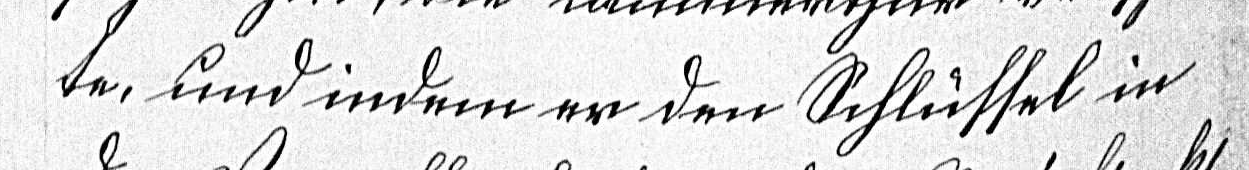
te, und indem er den Schlüssel in
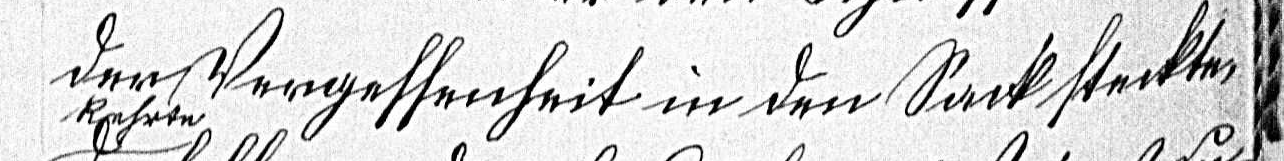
der Vergessenheit in den Sack steckte,
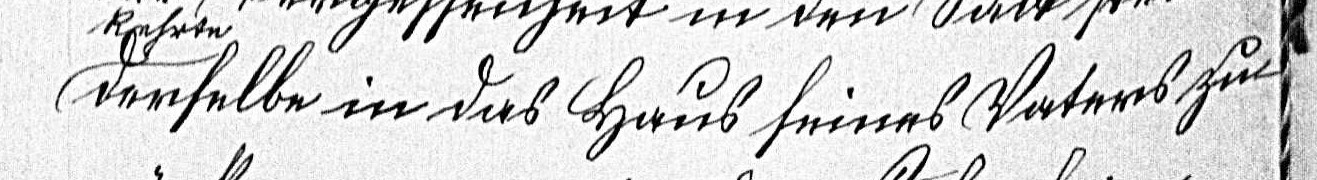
derselbe in das Haus seines Vaters zu¬
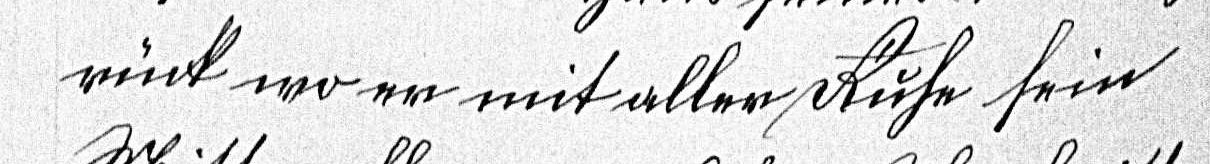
rück wo er mit aller Ruhe sein
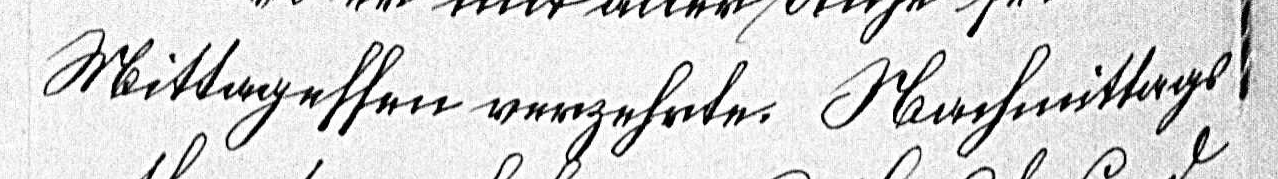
Mittagessen verzehrte. Nachmittags
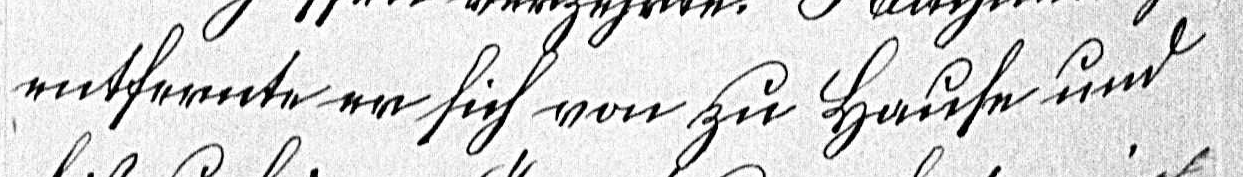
entfernte er sich von zu Hause und
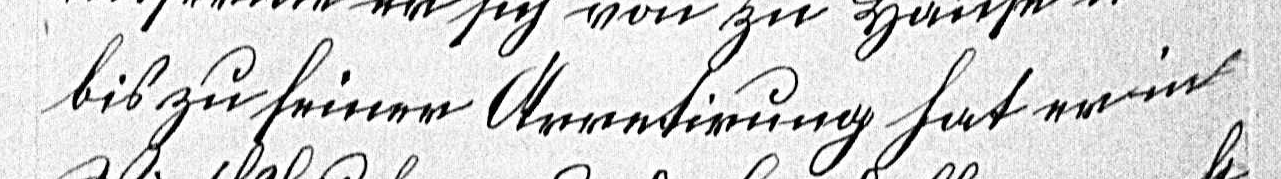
bis zu seiner Arretirung hat er in
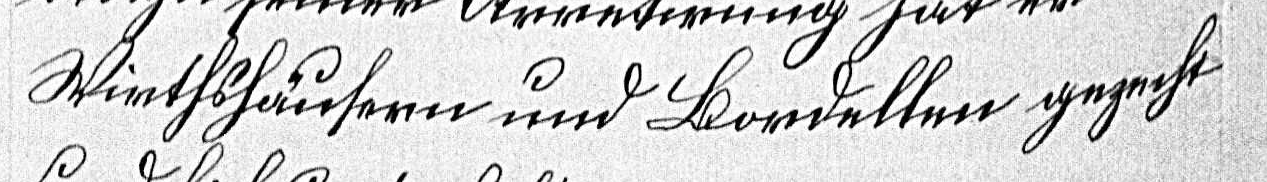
Wirtshäuser und Bordellen gezecht
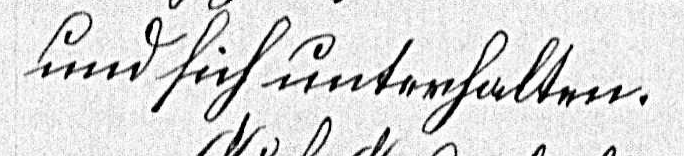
und sich unterhalten.
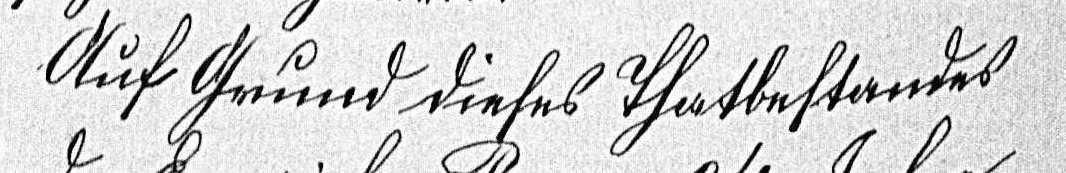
Auf Grund dieses Thatbestandes
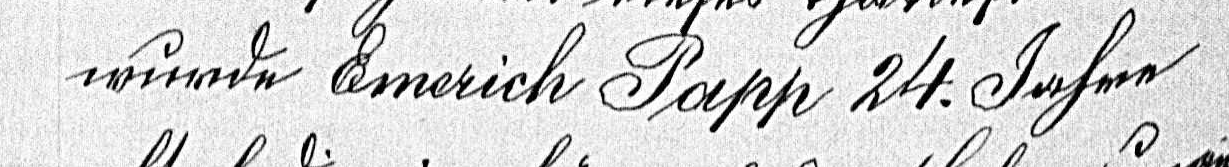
wurde Emerich Papp 24. Jahre
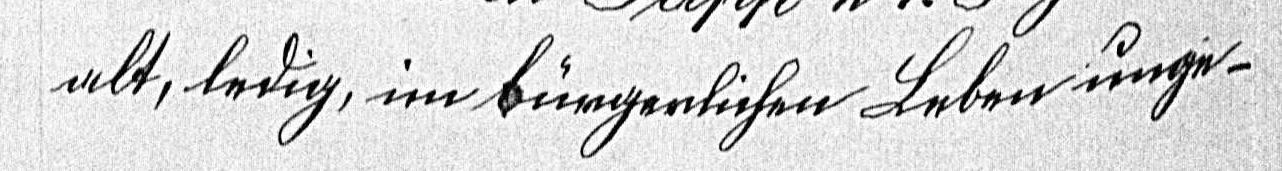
alt, ledig, in bürgerlichen Leben unge¬
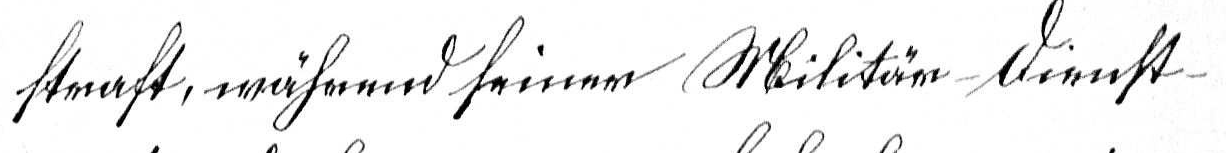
straft, während seiner Militär-Dienst¬
